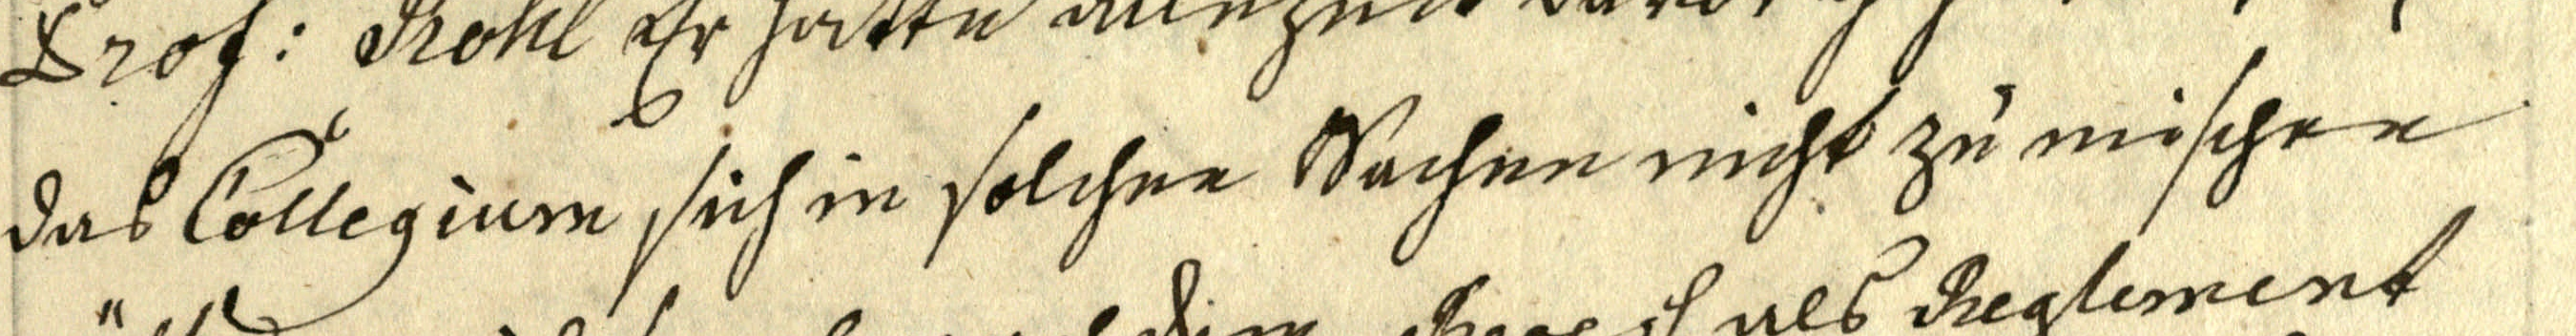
das Collegium sich in solchen Sachen nicht zu mischen
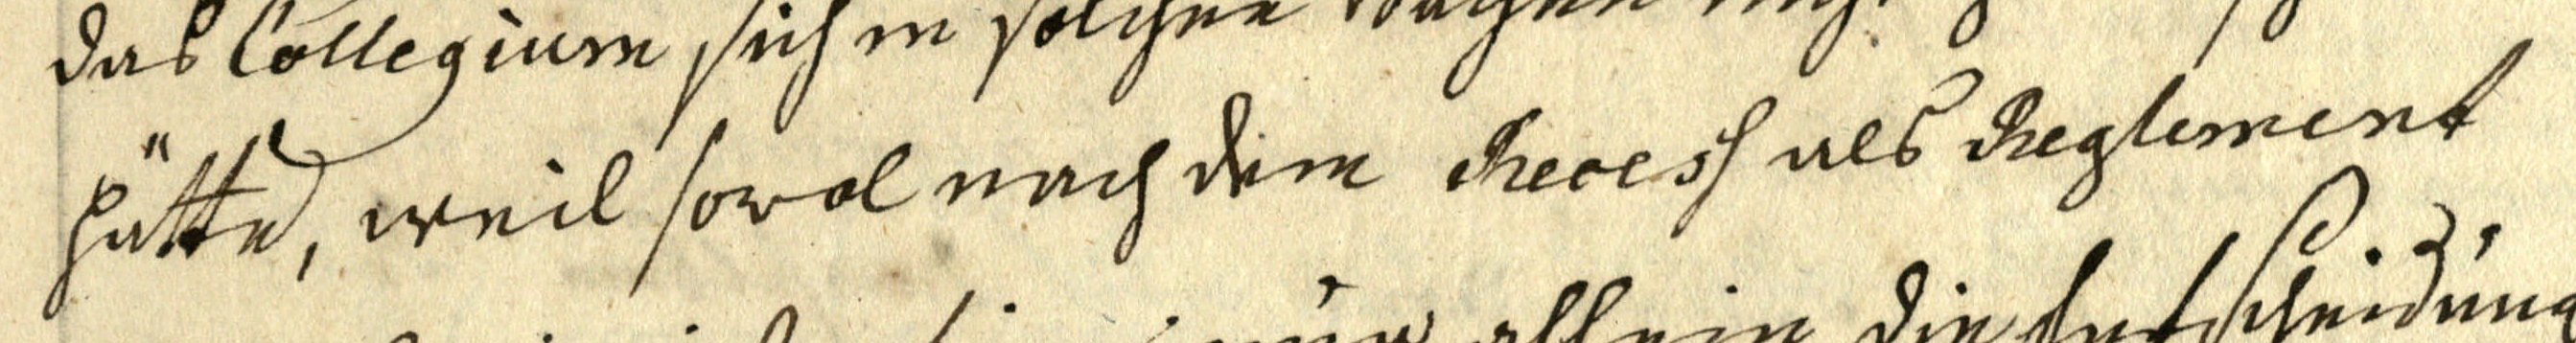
hätte, weil sowol nach dem Recess als Reglement
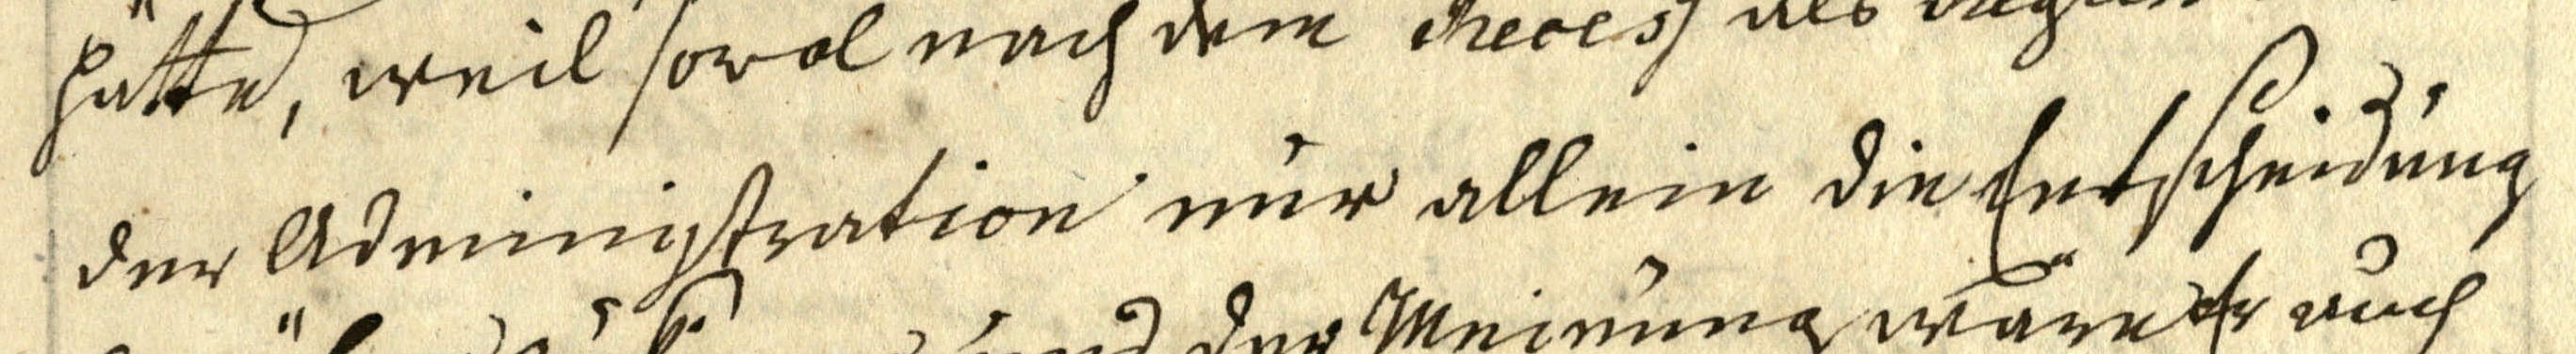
der Administration nur allein die Entscheidung
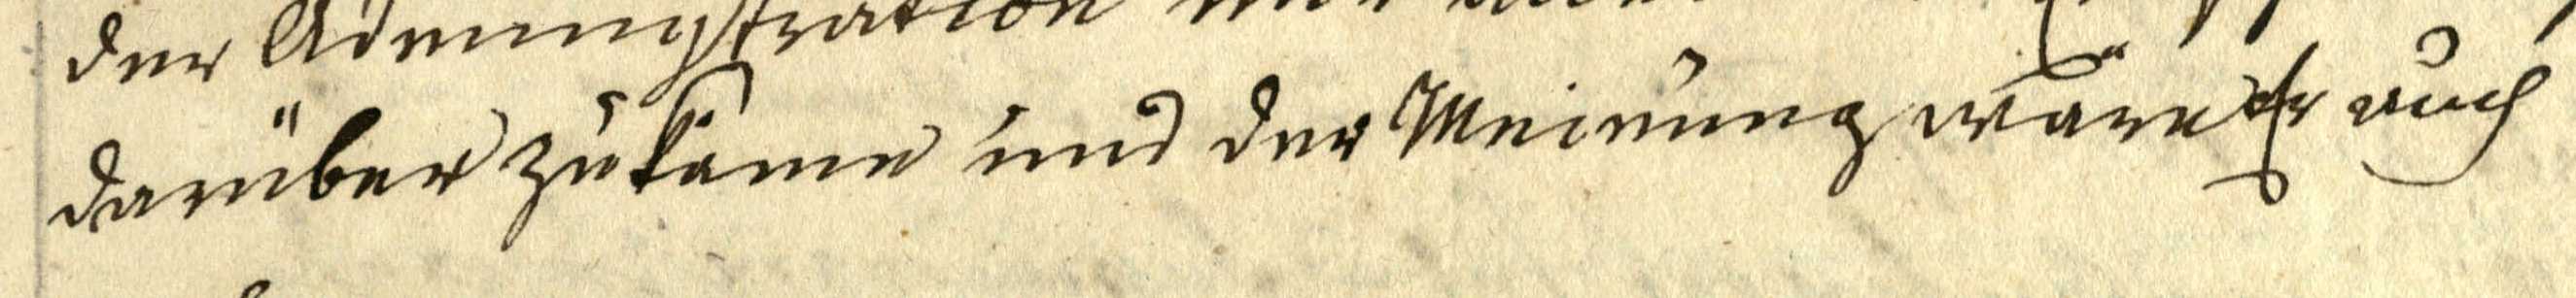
darüber zu käme und der Meinung wäre Er auch
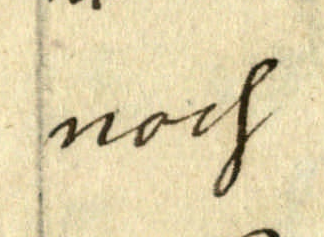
noch
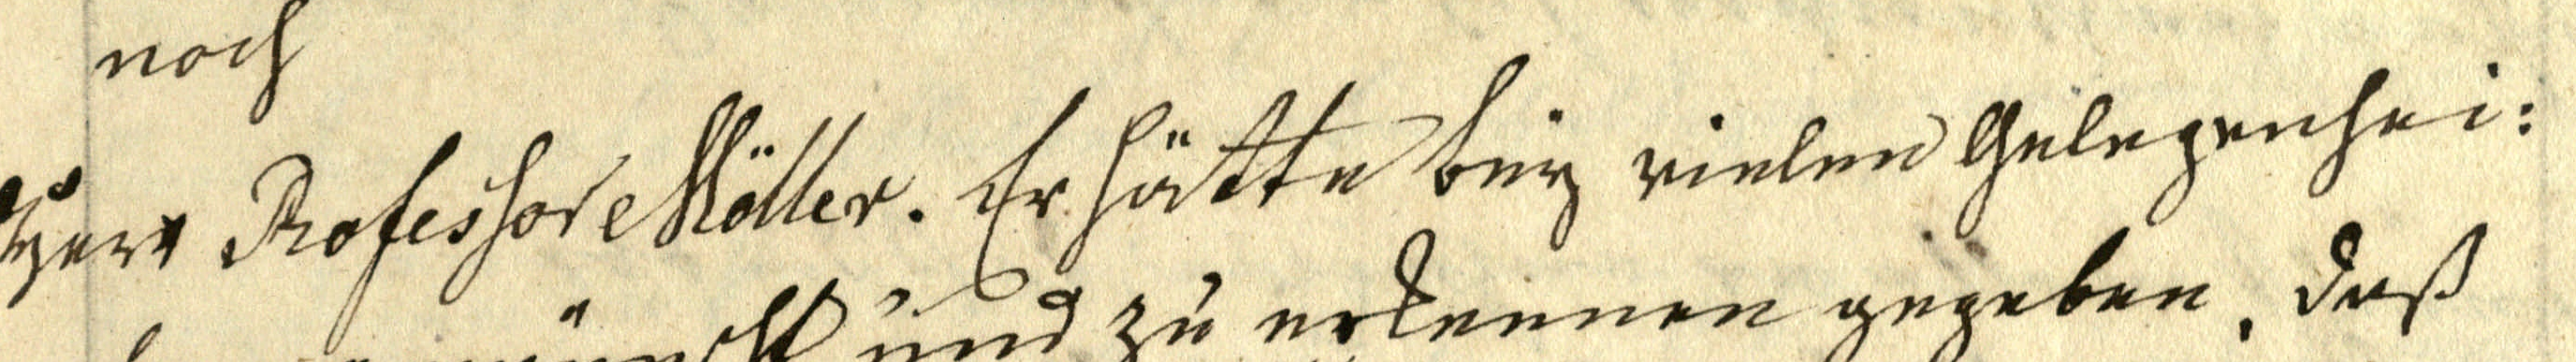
dHerr Professor Möller. Er hätte beÿ vielen Gelegenhei¬
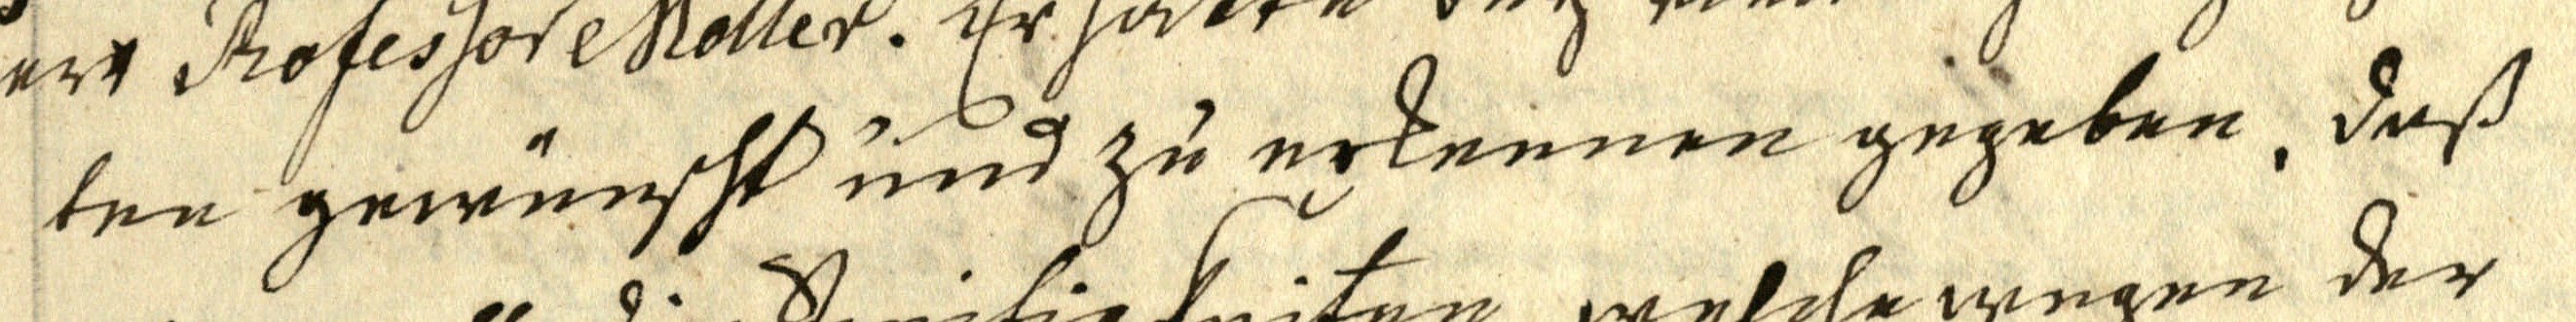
ten gewünscht und zu erkennen gegeben, daß
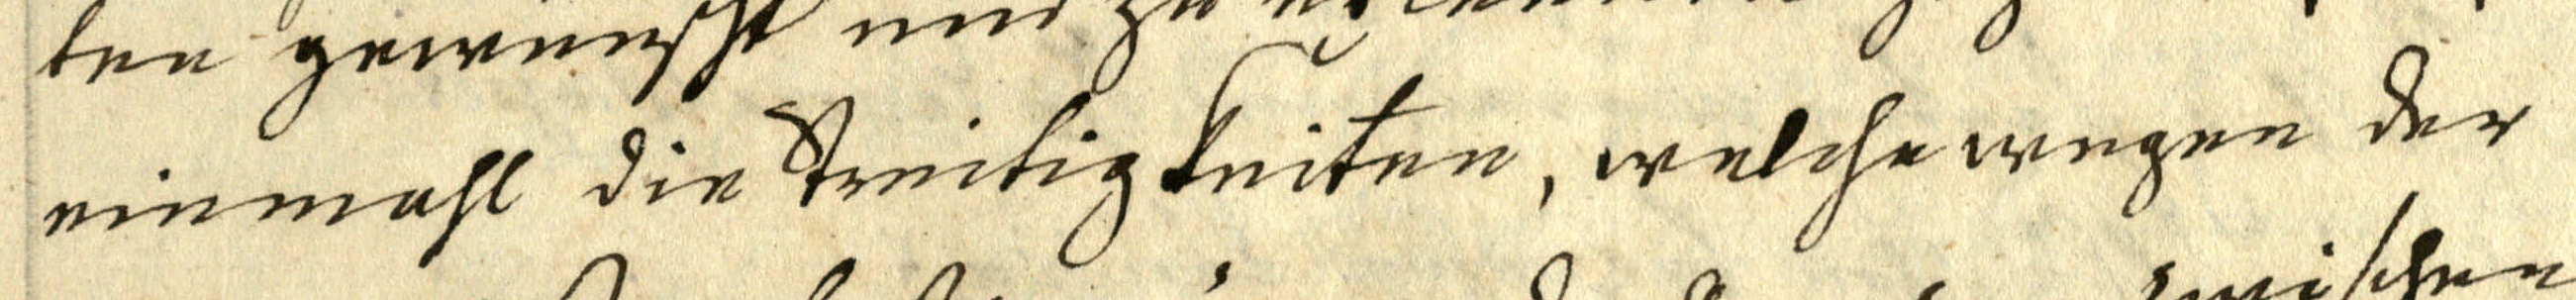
einmahl die Streitigkeiten, welche wegen der
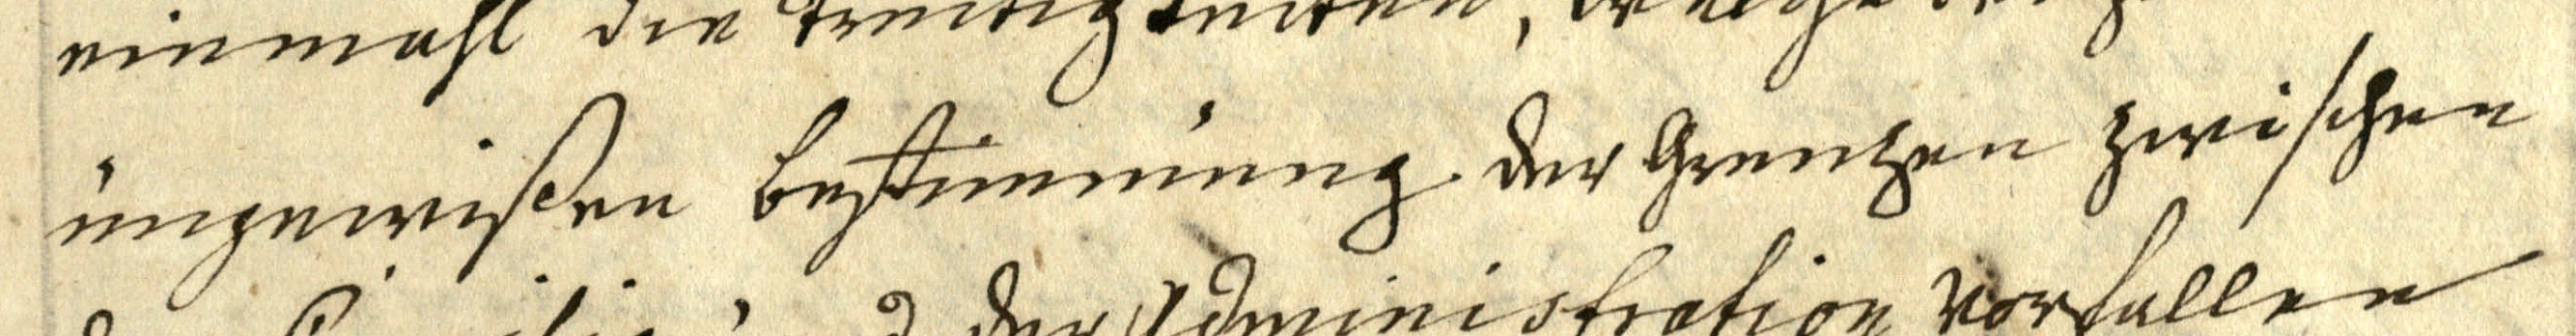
unmigewißen Bestimmung der Grenzen zwischen
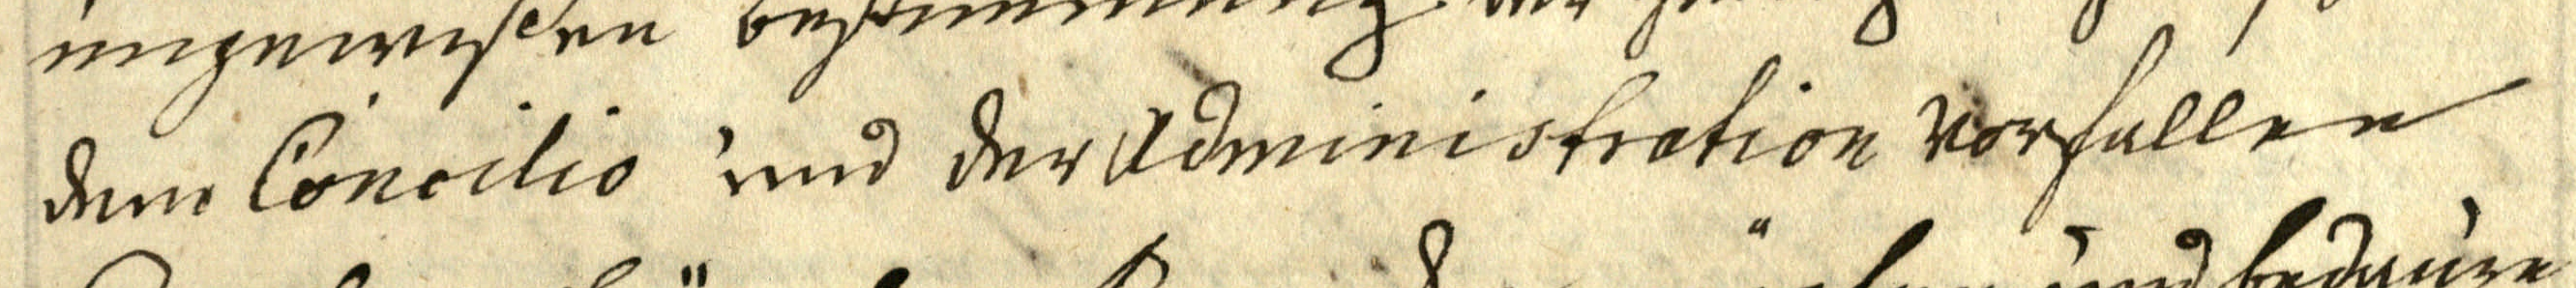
dem Concilio und der Administration vorfallen
